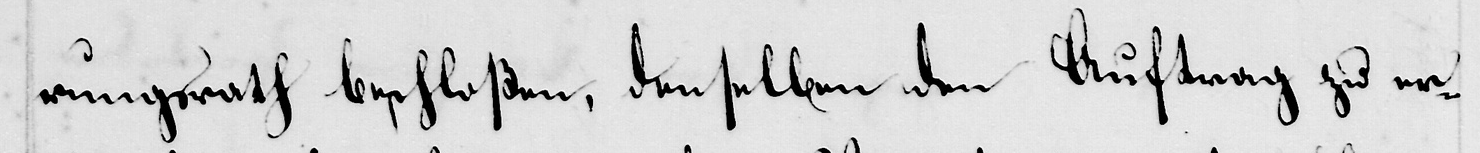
rungsrath beschloßen, denselben den Auftrag zu er¬
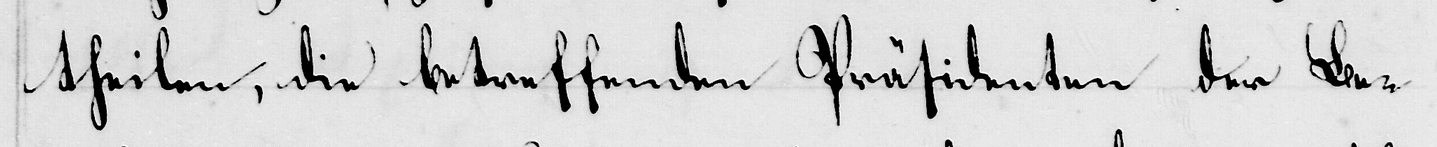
theilen, die betreffenden Präsidenten der Be¬
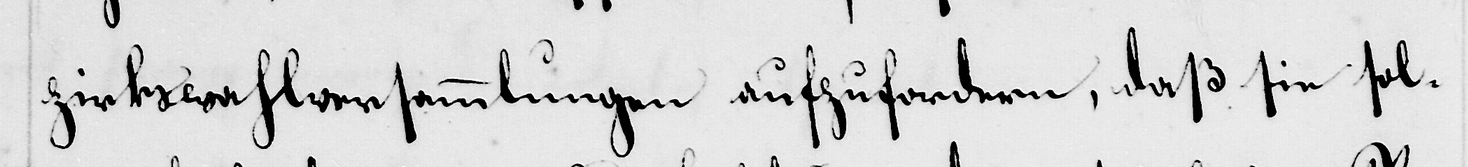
zirkswahlversammlungen aufzufordern, daß sie sol¬
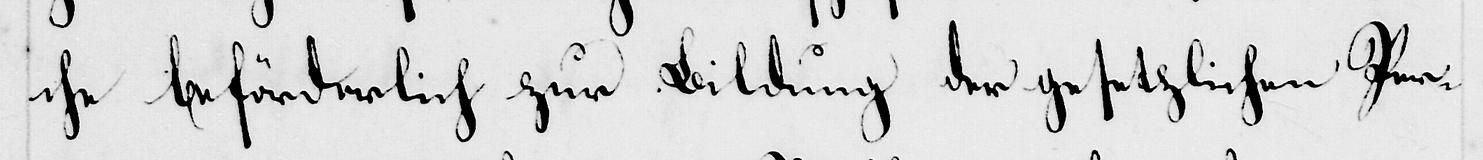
che beförderlich zur Bildung der gesetzlichen Per¬
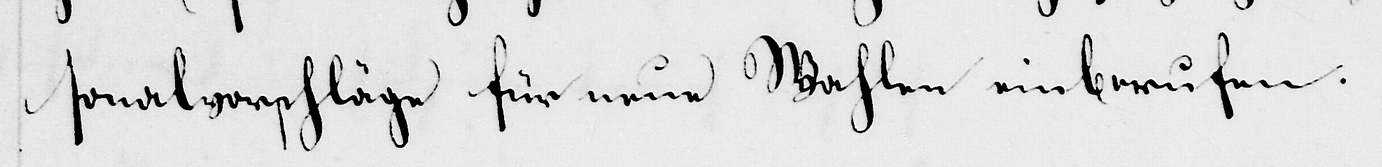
sonalvorschläge für neue Wahlen einberufen.
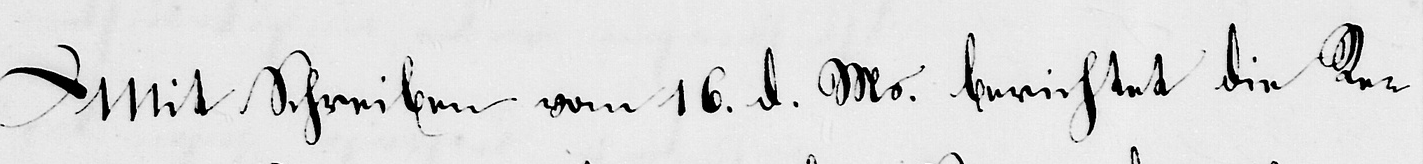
Mit Schreiben vom 16. d. Ms. berichtet die Re¬
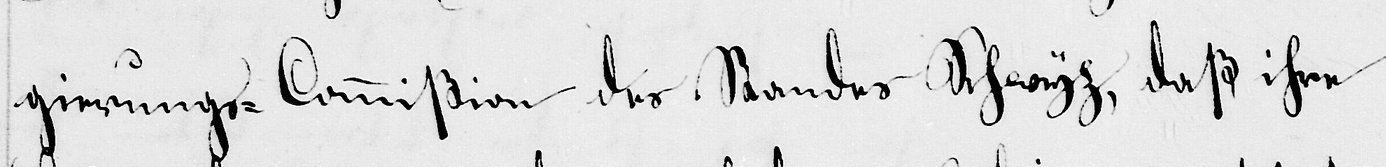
gierungs-Commißion des Standes Schwyz, daß ihre
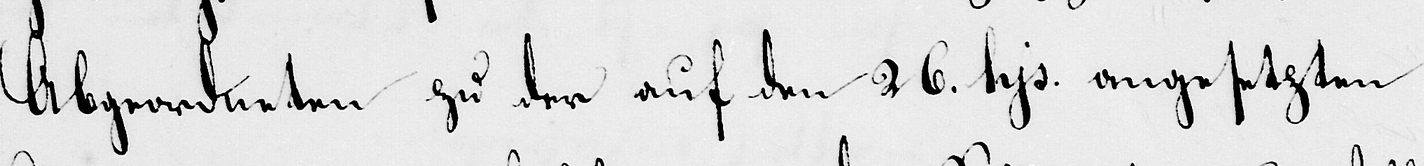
Abgeordneten zu der auf den 26. hjs. angesetzten
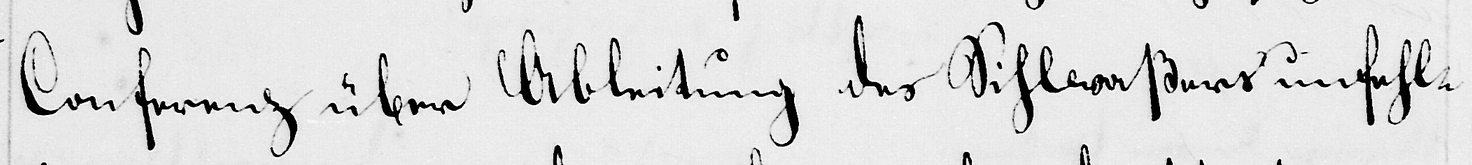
Conferenz über Ableitung des Sihlwaßers unfehl¬
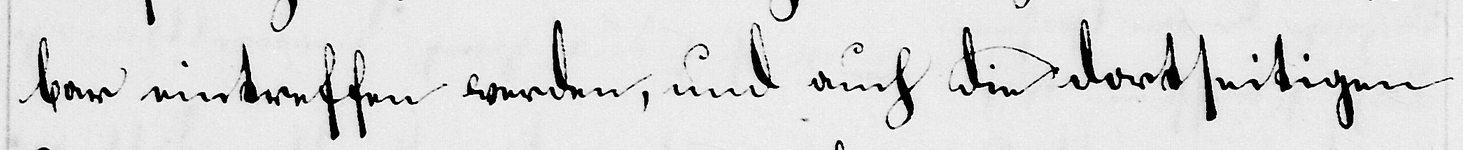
bar eintreffen werden, und auch die dortseitigen
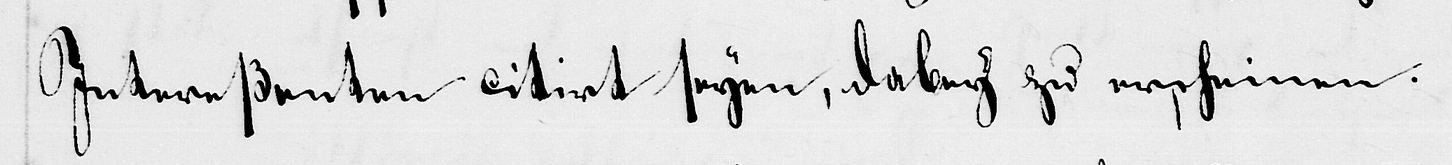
Intereßenten citirt seyen, dabey zu erscheinen.
